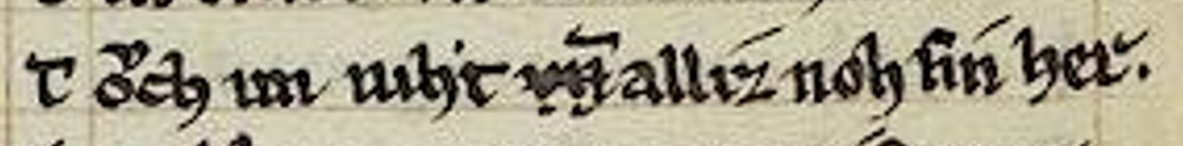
To°vch im niht vn(d) alliz noh ſin her.
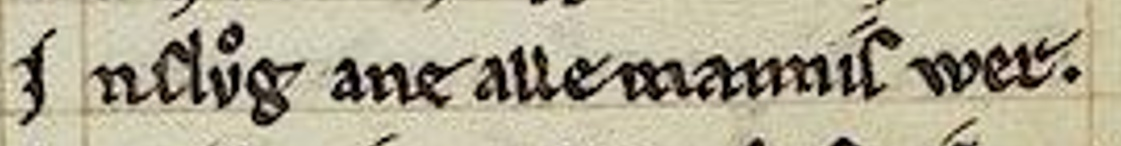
In ſlv°og ane alle manniſ wer.
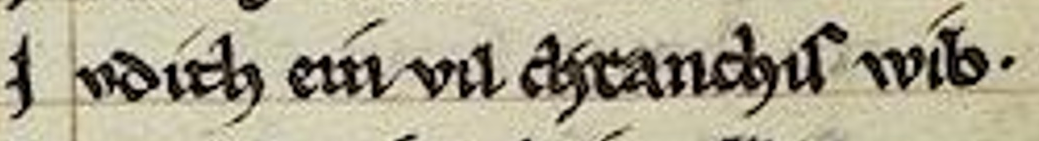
Ivdith ein vil chranchiſ wib.
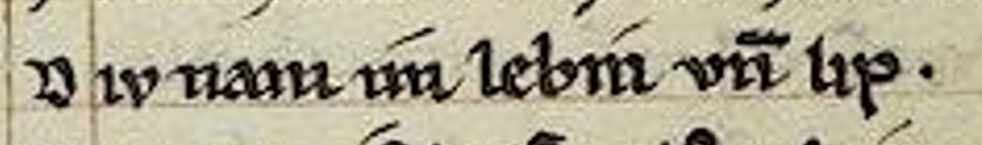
Div nam im lebin vn(d) lip.
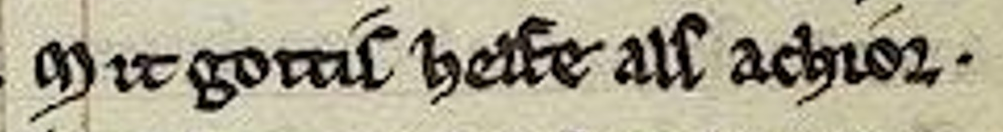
Mit gottiſ helfe alſ achior.
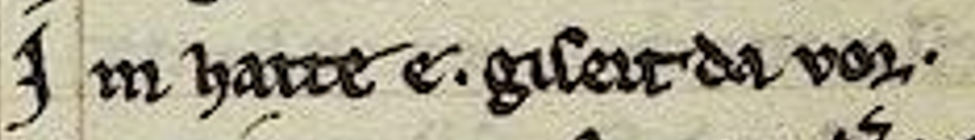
Im hatte e. giſeit da vor.
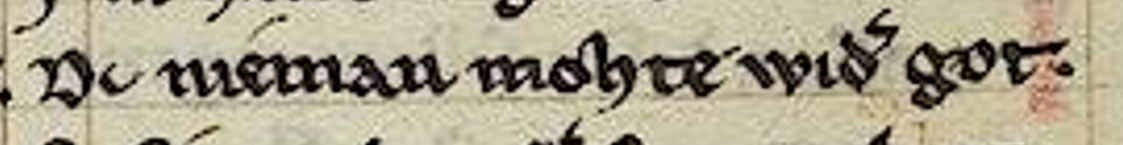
D(az) nieman mohte wid(er) got.
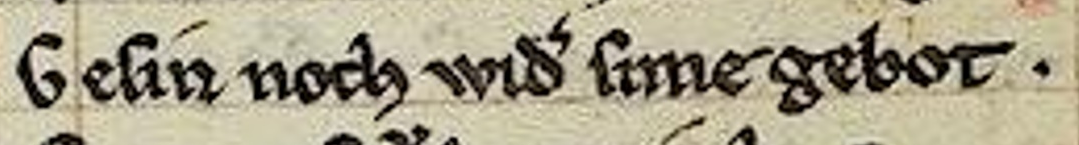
Geſin noch wid(er) ſime gebot.
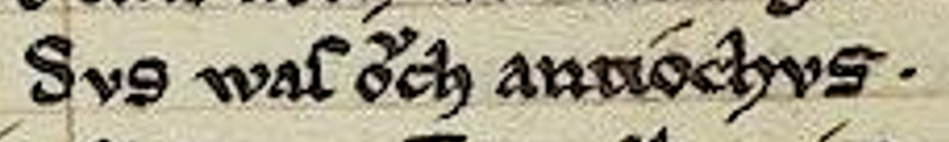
Svs waſ o°vch antiochvs.
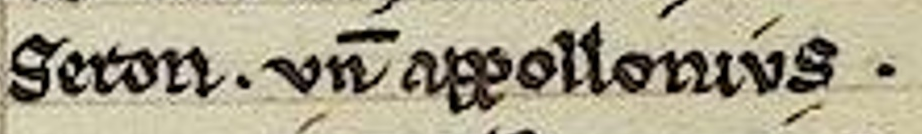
Seron. vn(d) appollonivs.
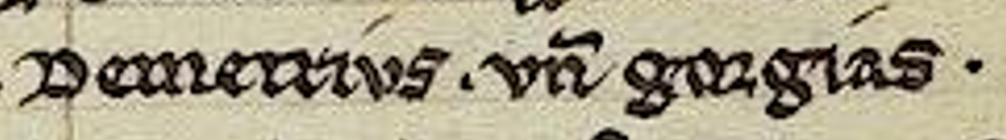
Demetrivs. vn(d) gorgias.
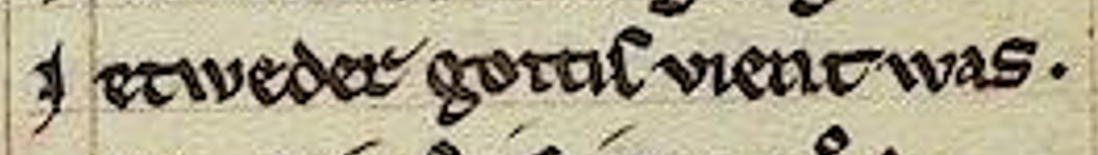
Ietweder gottis vient was.
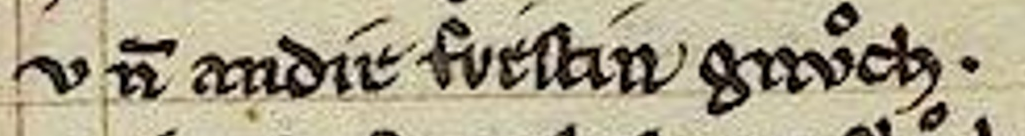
Vn(d) andir fvrſtin gnv°och.
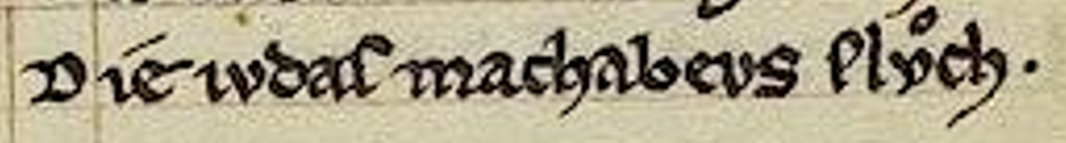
Die ivdaſ machabeus ſlv°och.
